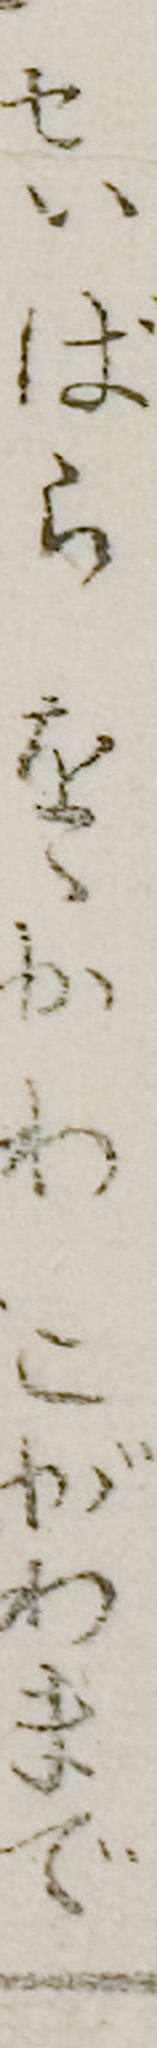いばらをゝかわこがわまで
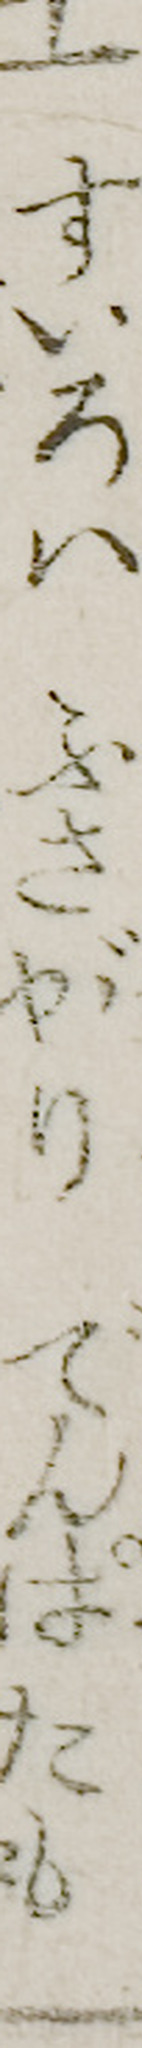十一すいろハふさがりでんばたも
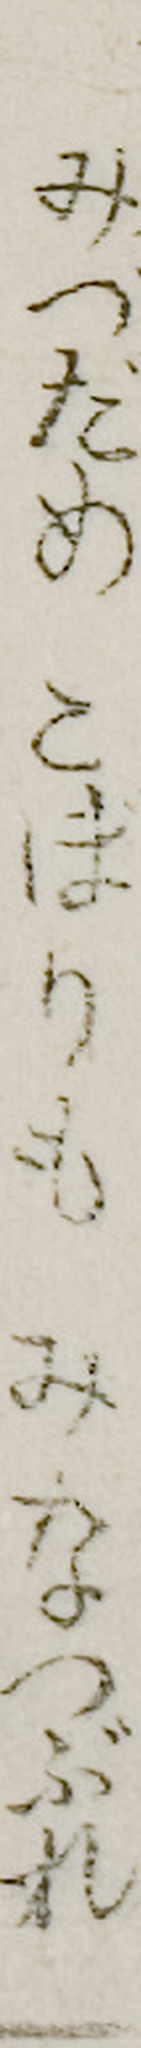みづだめこぼりもみなつぶれ
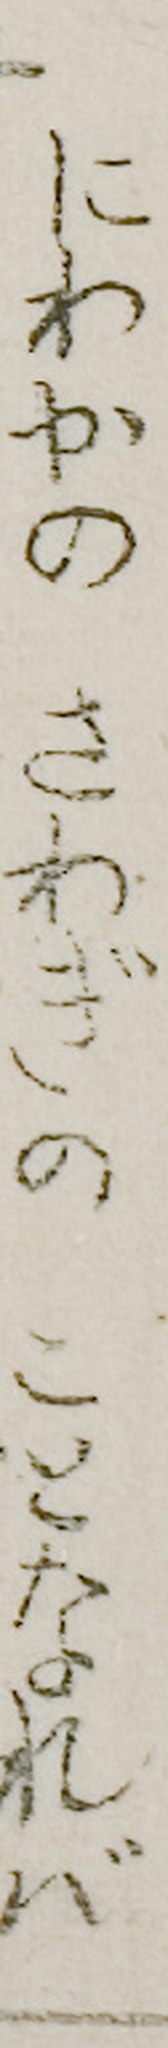にわかのさわぎのことなれバ
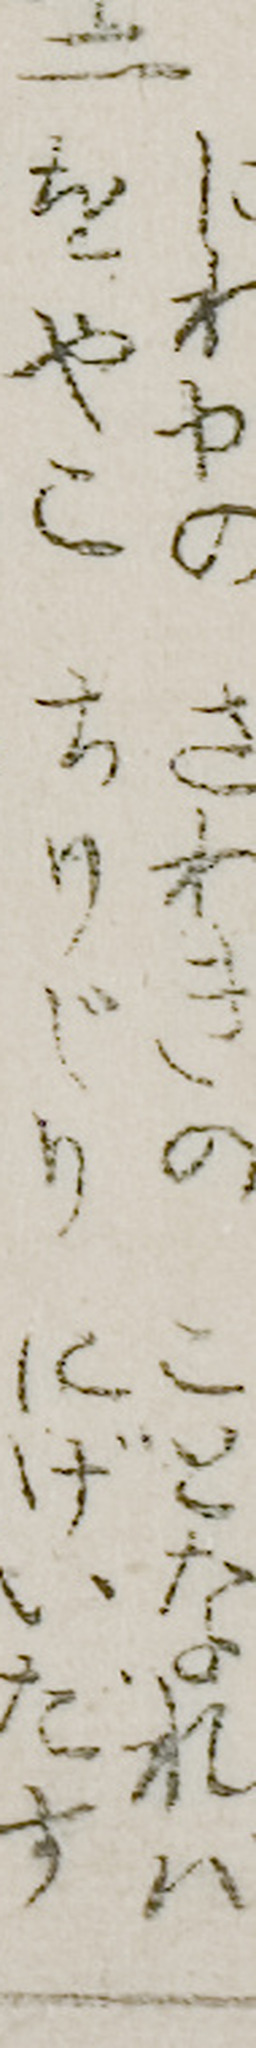十二をやこちりじりにげいだす
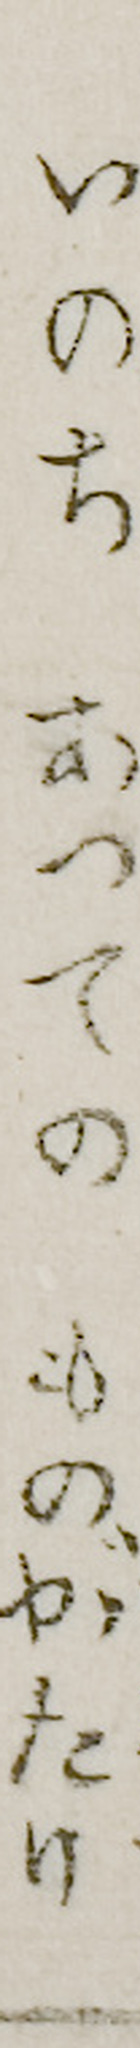いのちあつてのものがたり
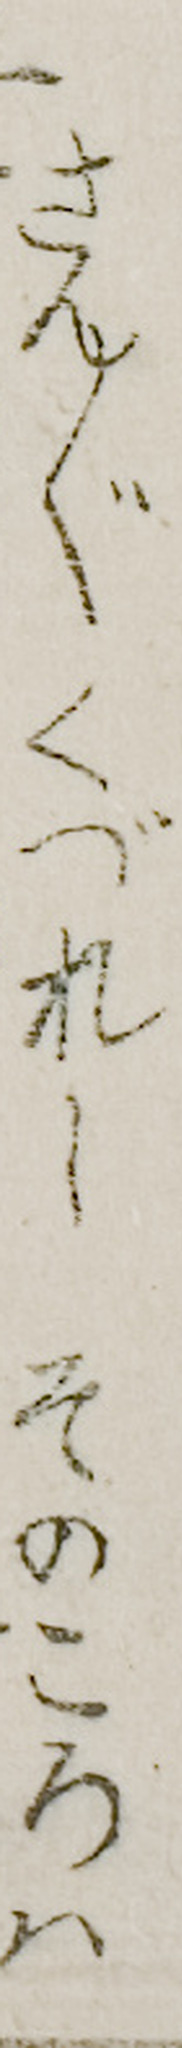さん〴〵くづれしそのころハ
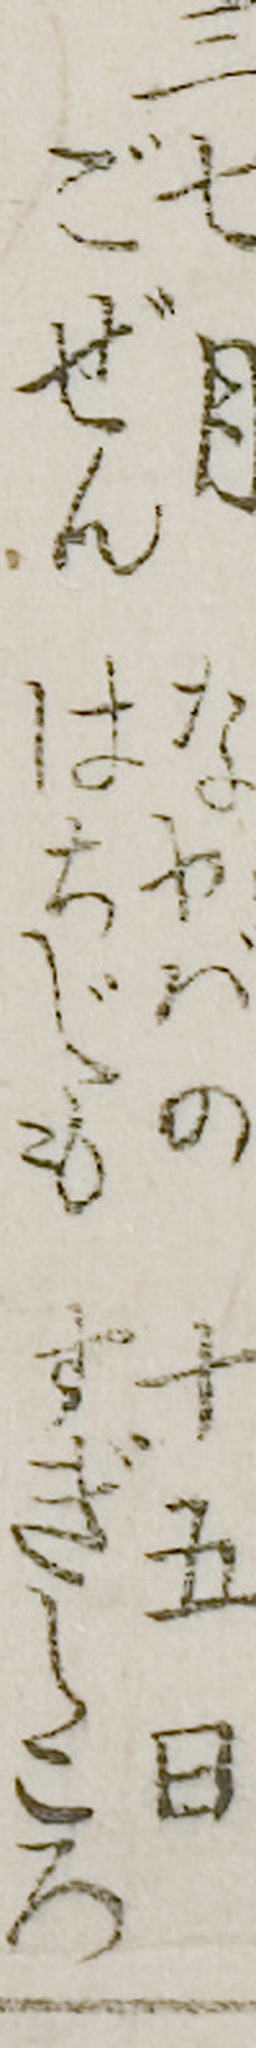ごぜんはちじもすぎしころ
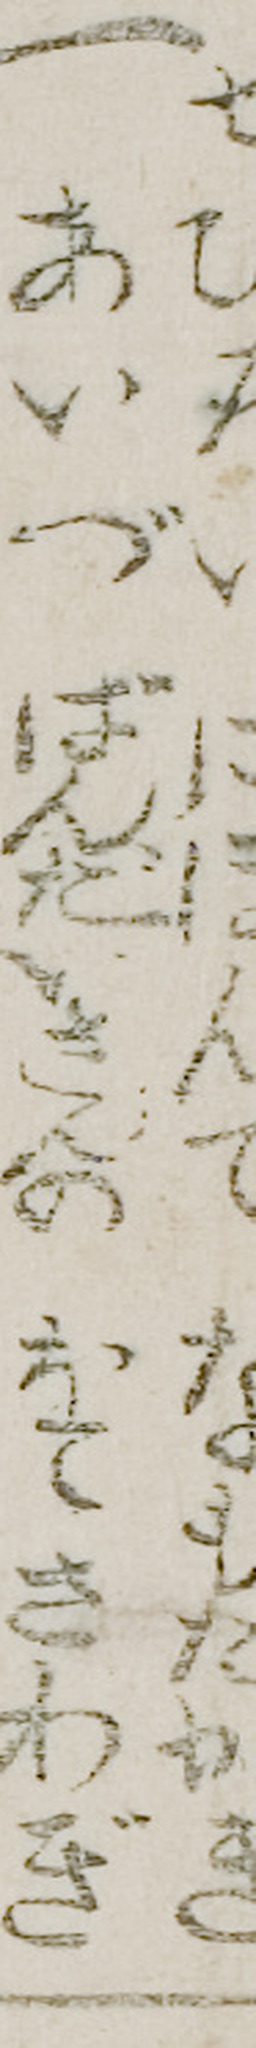一あいづばんだいさんのおゝさわぎ
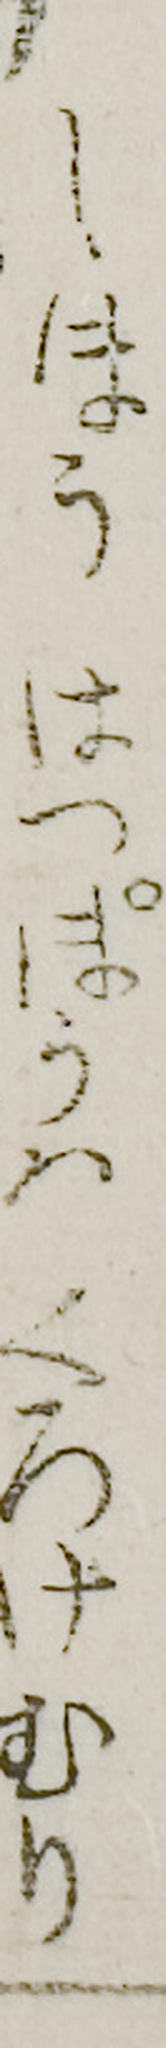しほうはつぽうくろけむり
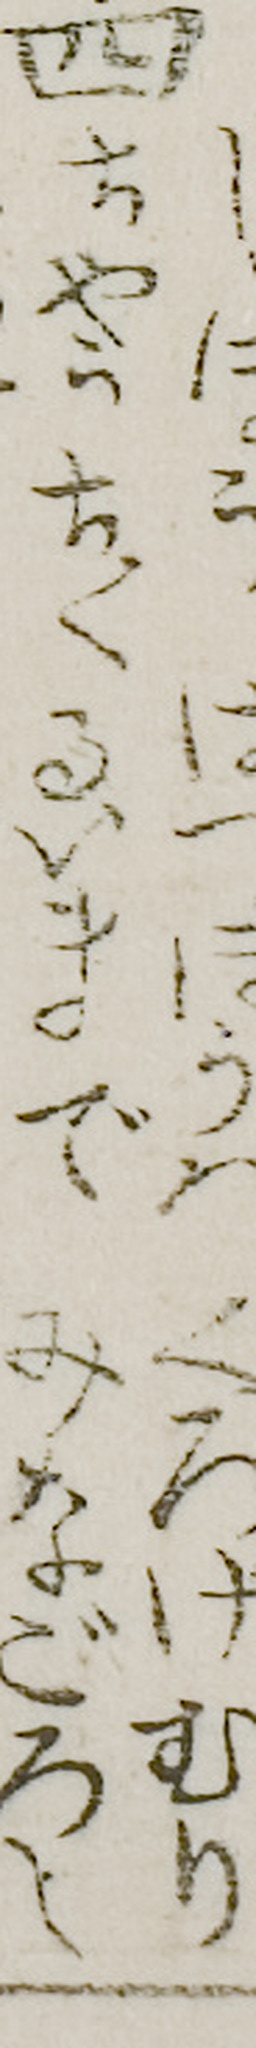十四ちやうちくるいまでみなごろし
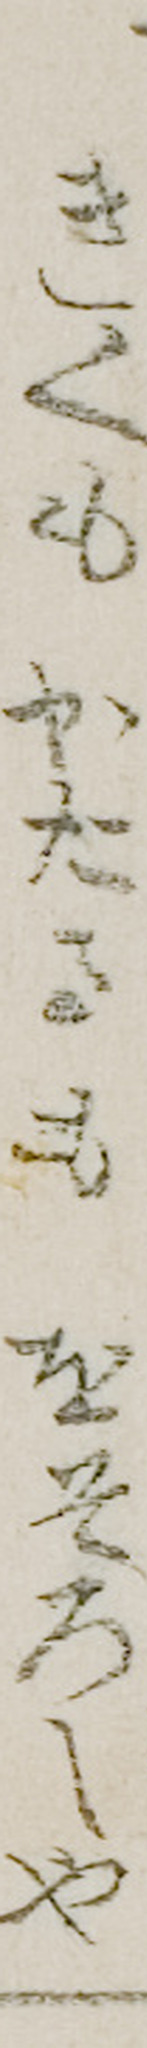きくもかたるさもをそろしや
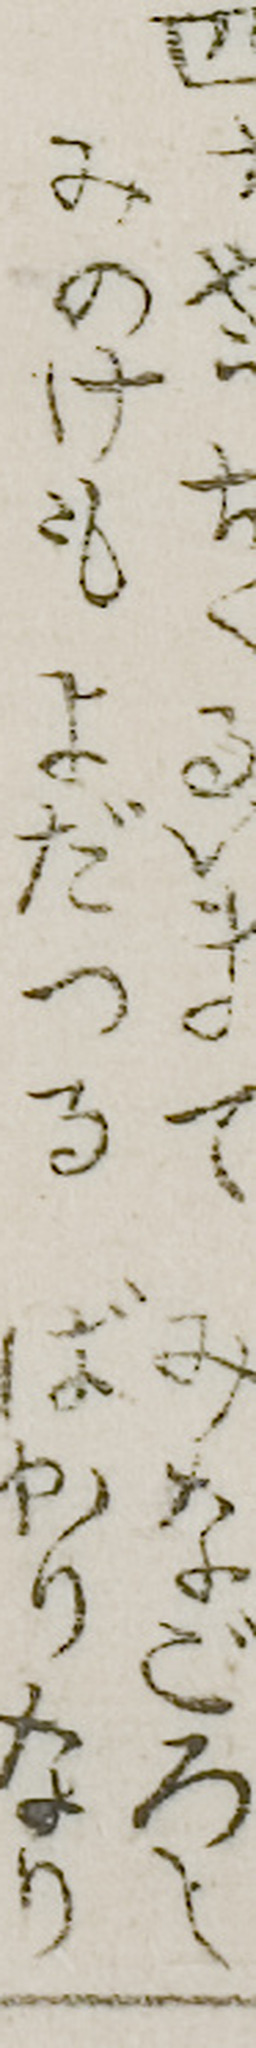みのけもよだつるばかりなり
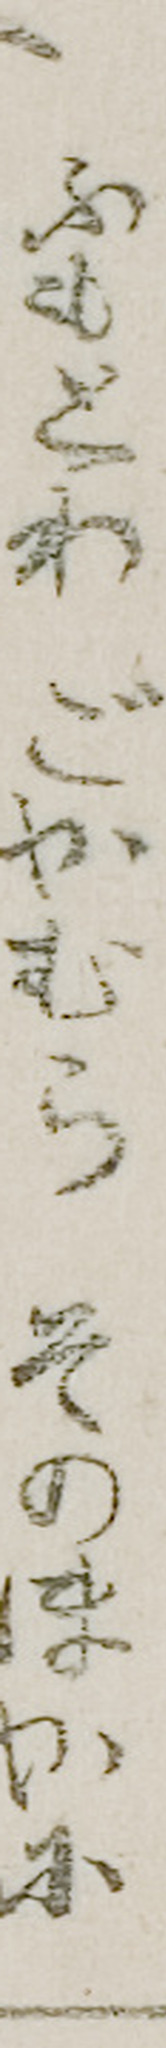ふもとわごかむらそのほかに
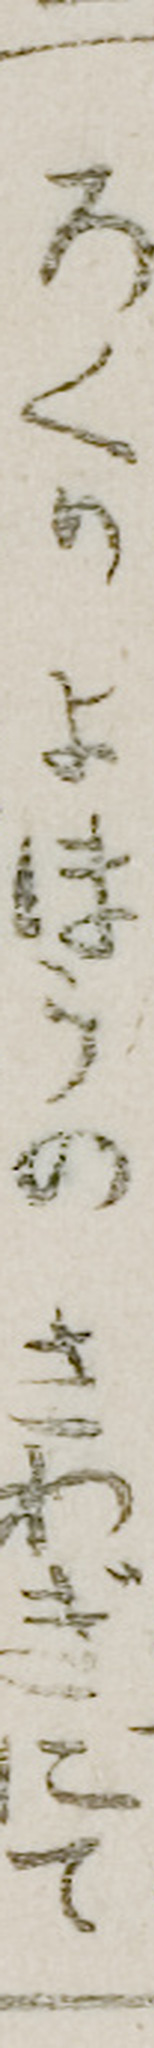二ろくりよほうのさわぎにて
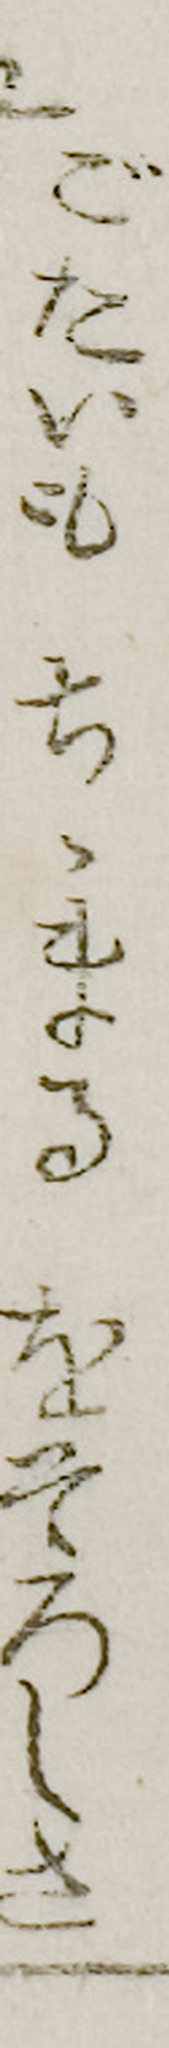ごたいもちゝまるをおろしさ
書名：会津ばんだいさん大くづれはなし
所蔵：東京大学総合図書館 General Library in the University of Tokyo, JAPAN
